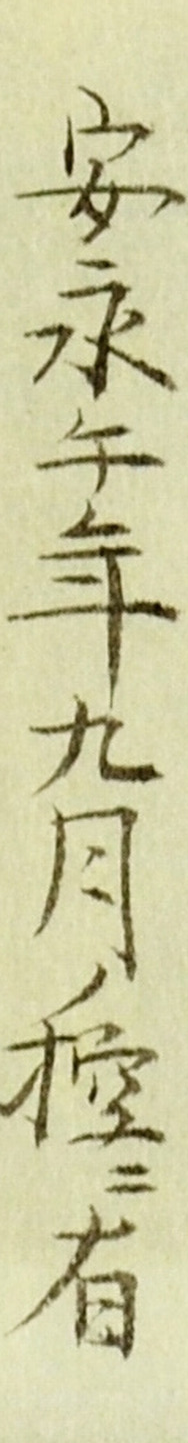安永午年九月ノ控ニ有
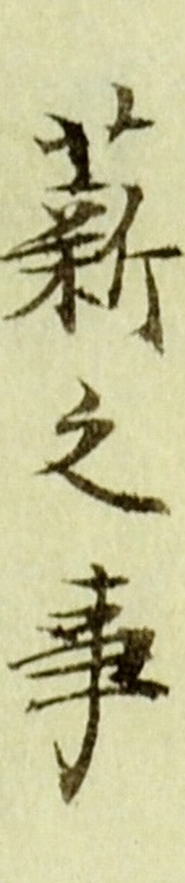薪之事
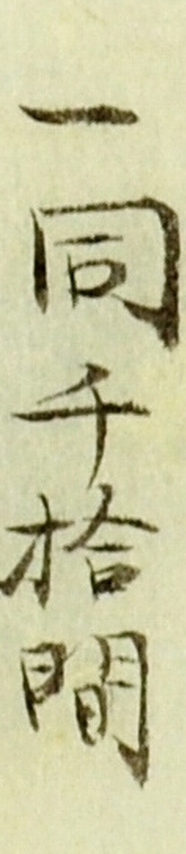一同千拾間
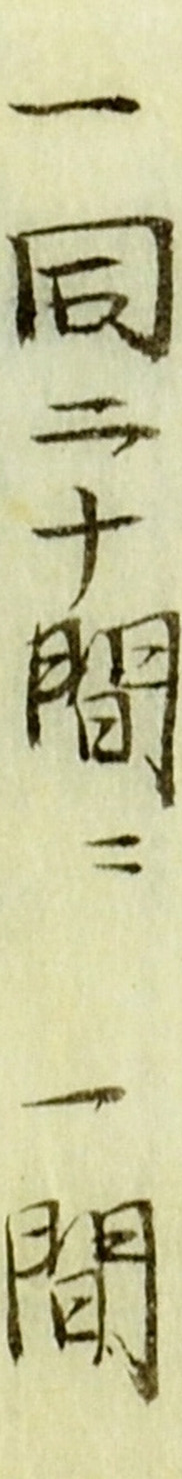一同二十間ニ一間
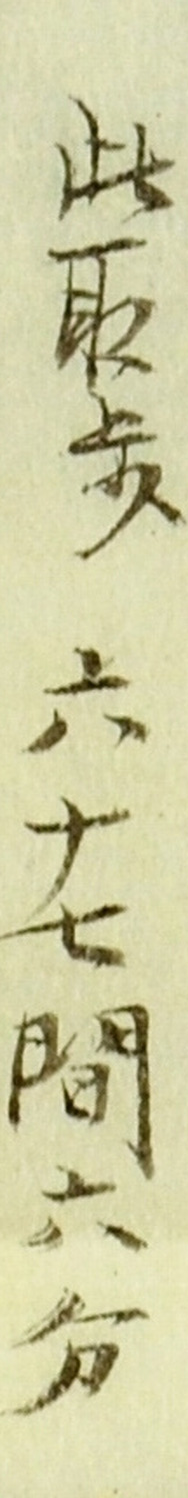此取歩六十七間六分
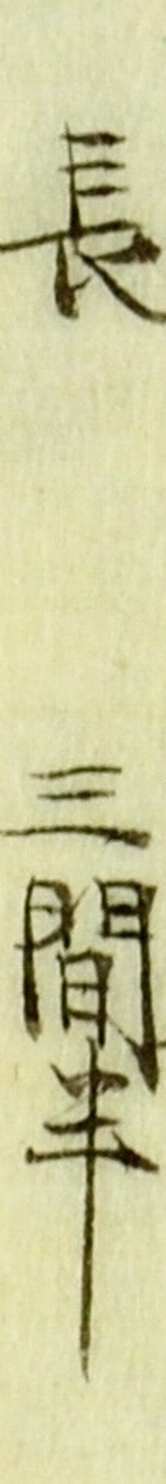長三間半
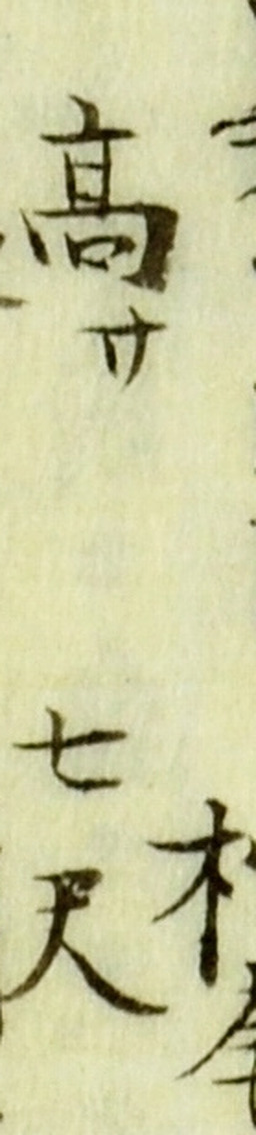高サ七尺
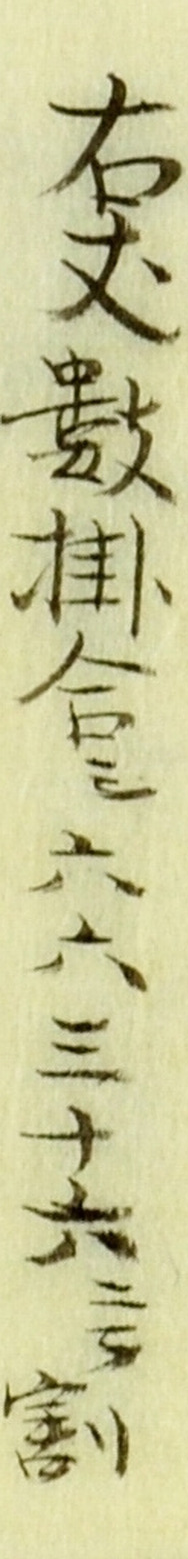右丈数掛合シ六六三十六ニテ割
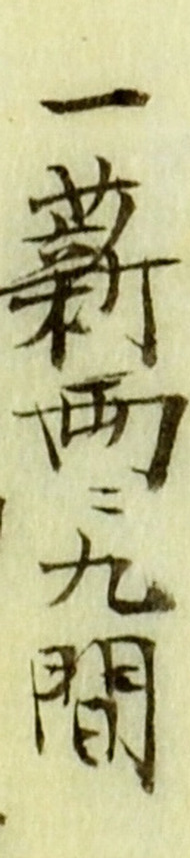一薪両ニ九間
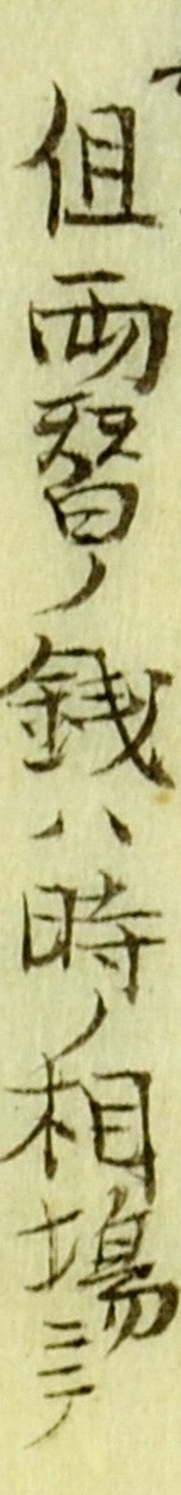但両替ノ銭ハ時ノ相場ニテ
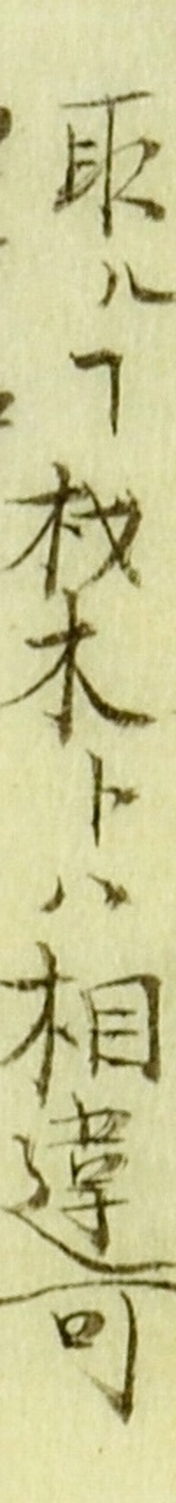取ル事材木トハ相違可
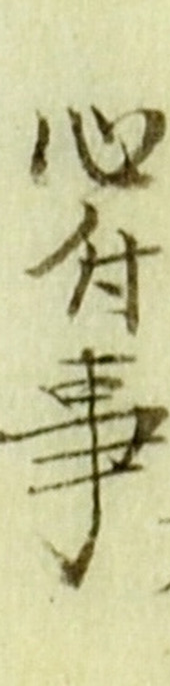心付事
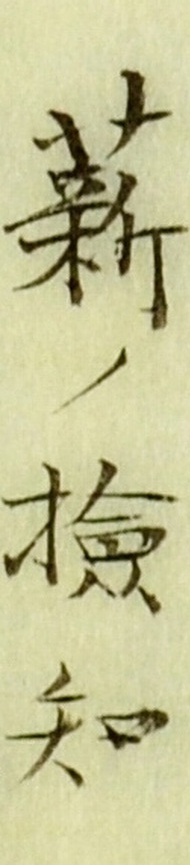薪ノ検知
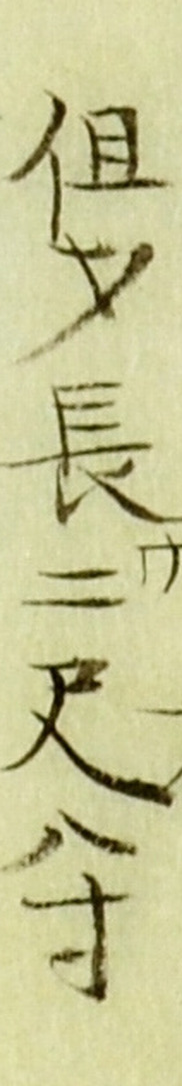但才長サ二尺八寸
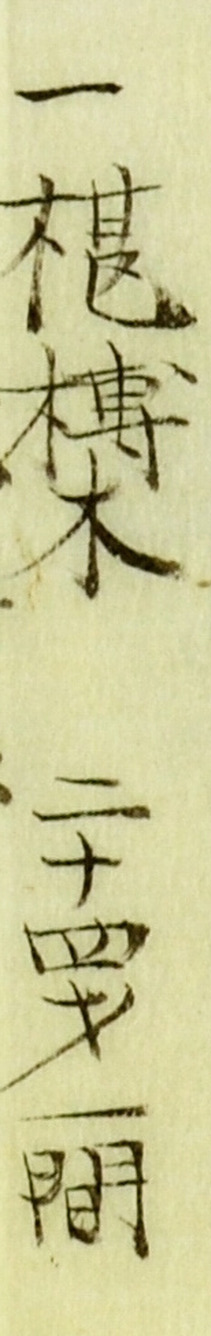一椹榑木二十四才一間
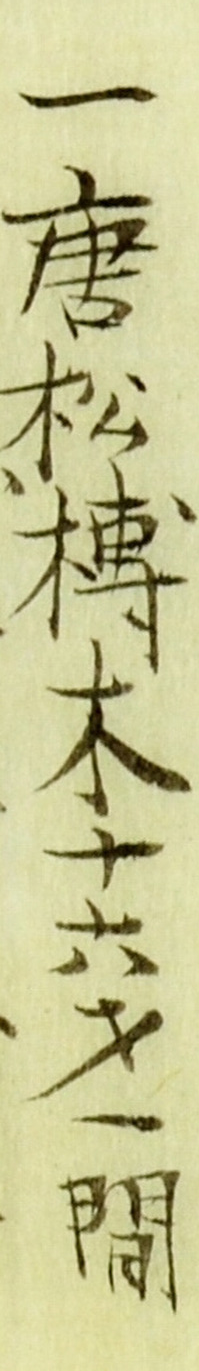一唐松榑木十六才一間
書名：分一御定法
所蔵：伊那市立高遠町図書館・合同会社AMANE
